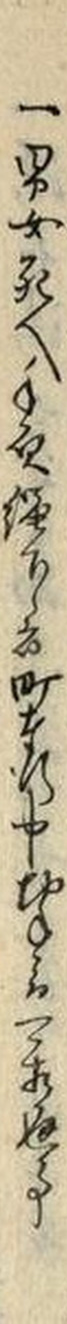一男女死人手負縄下之者町奉行中切手ニ而可相通候事
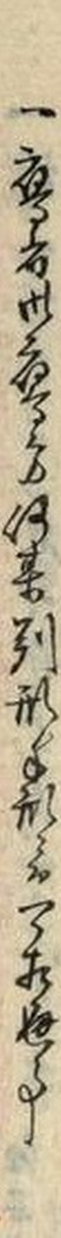一鷹者御鷹方何某判形手形ニ而可相通候事
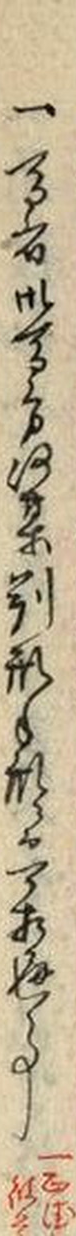一馬者御馬方何某判形手形ニ而可相通候事
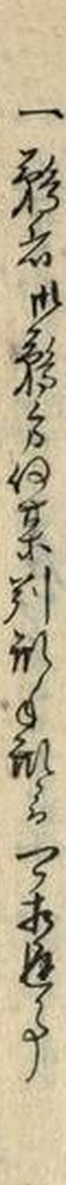一鵜者御鵜方何某判形手形ニ而可相通候事
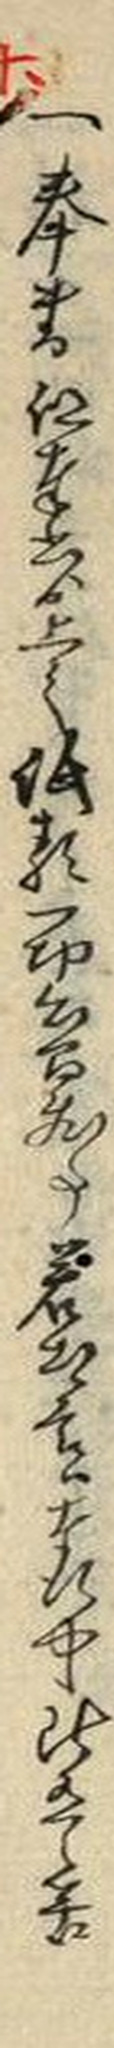一奉書但奉書ゟ上之紙類一切出間敷事若出候節ハ奉行中断有之筈

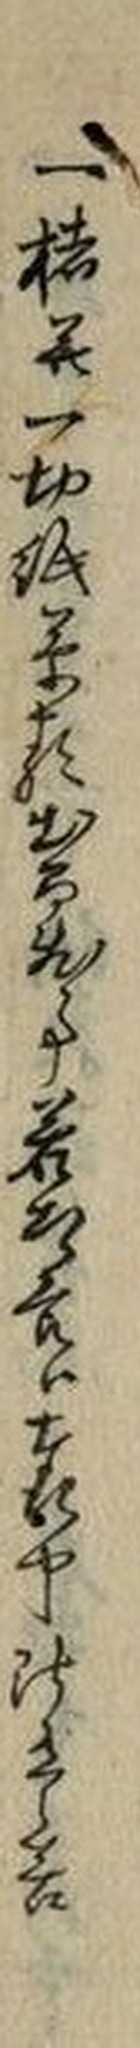一楮幷一切紙草類出間敷事若出候節ハ奉行中断有之筈
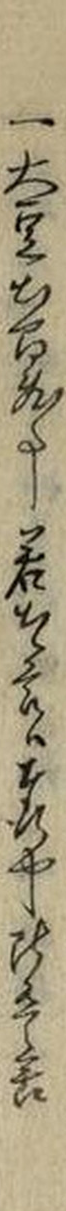一大豆出間敷事若出候節ハ奉行中断有之筈
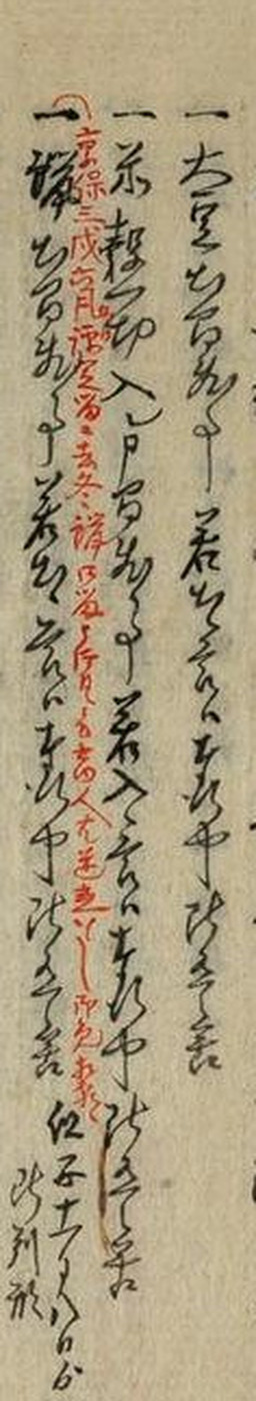一米穀一切入レ申間敷事若入候節ハ奉行中断有之筈
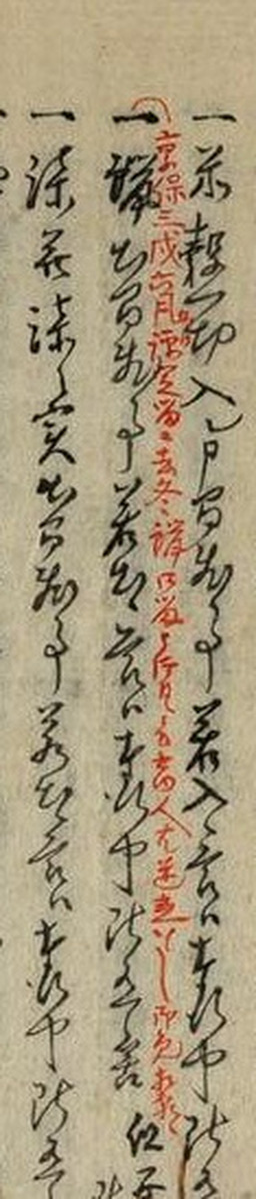一大豆出間敷事若出候節ハ奉行中断有之筈
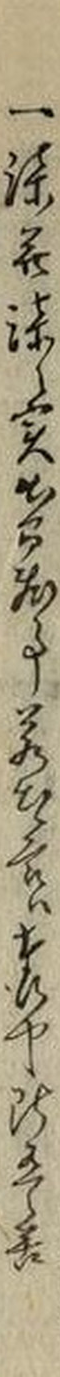一漆幷漆之実出間敷事若出候節ハ奉行中断有之筈
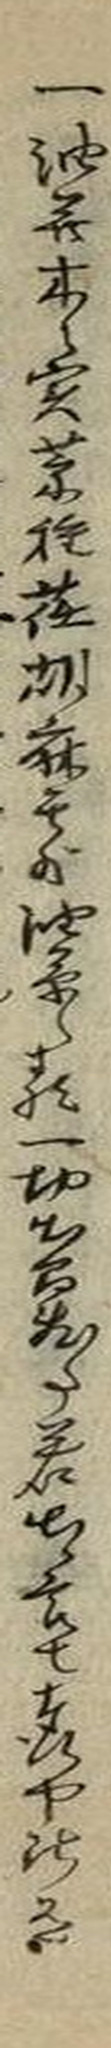一油幷木之実菜種荏胡麻其外油草之類一切出間敷事若出候節ハ奉行中断有
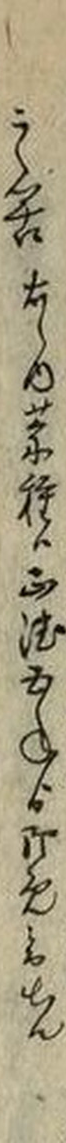之筈右之内菜種ハ正徳五年ゟ御免ニ而出ル
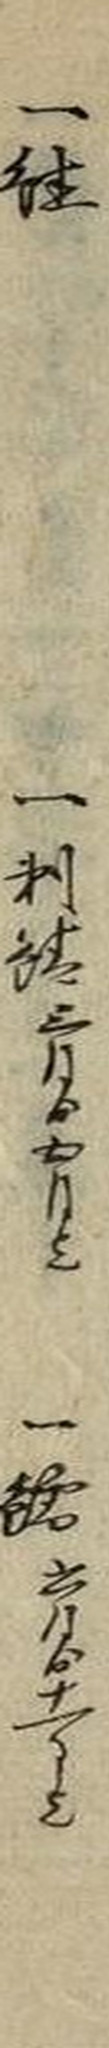一鮭一刺鯖三月ゟ五月迄一鱈六月ゟ十一月迄
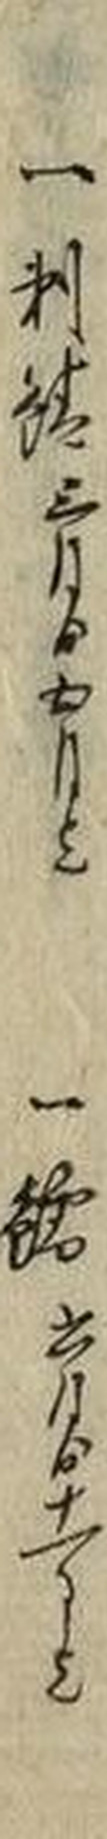一鮭一刺鯖三月ゟ五月迄一鱈六月ゟ十一月迄
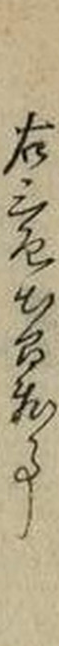右三色出間敷事
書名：御国他国諸事之部
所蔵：福井県文書館 Fukui Prefectural Archives
